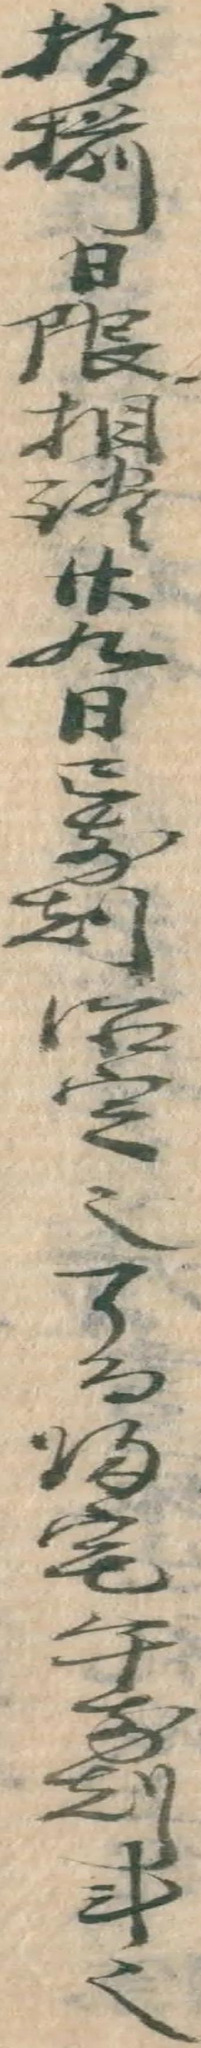指揃日限相談廿九日巳前刻治定也了而帰宅午前刻斗也
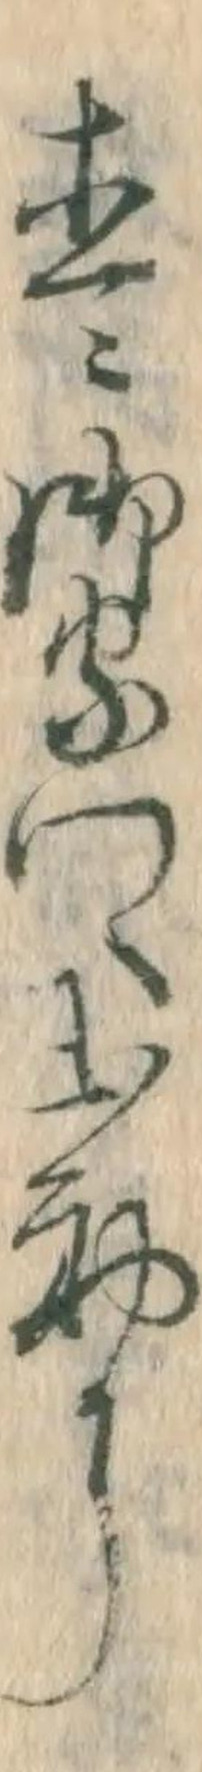直ニ御家門ヘ出勤了
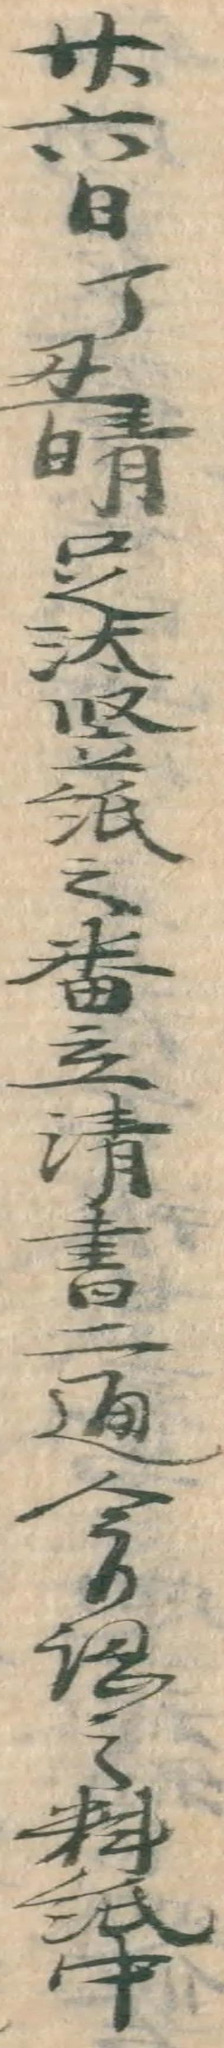廿六日丁丑晴足汰堅紙之番立清書二通今日認之料紙中
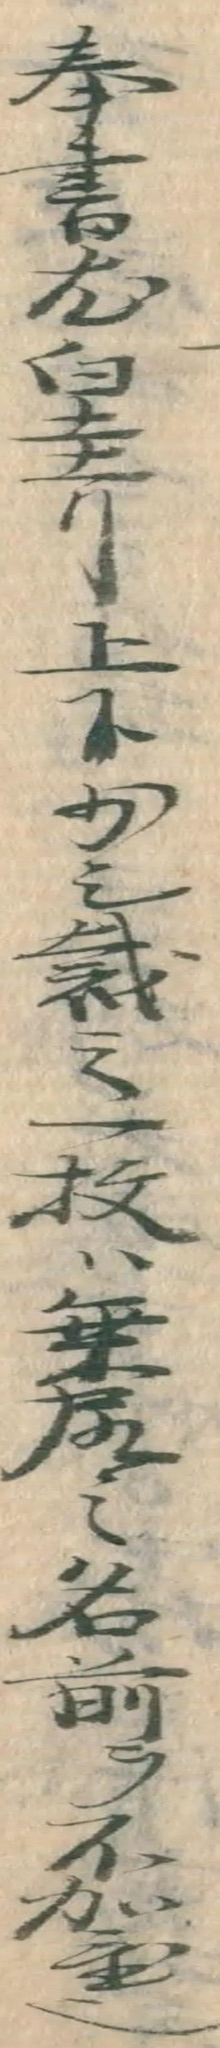奉書尤白圭引上下少シ裁之一枚ハ乗尻之名前ヲ不加置也
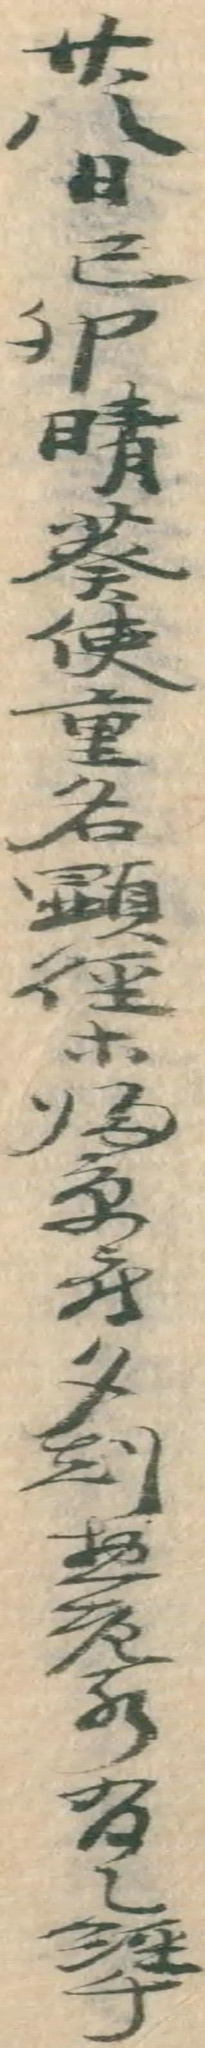廿八日己卯晴葵使重名顕径等帰京ニ付夕刻惣老若有之経千

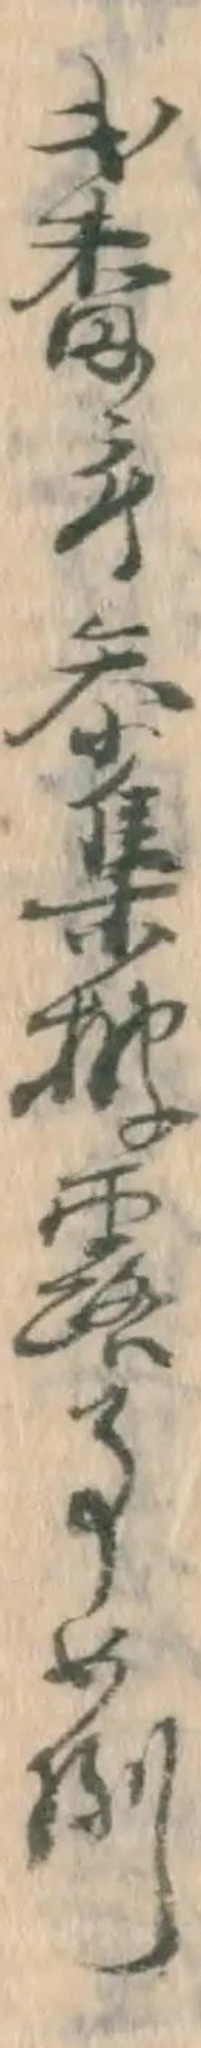本番ニ付参集披露事如例
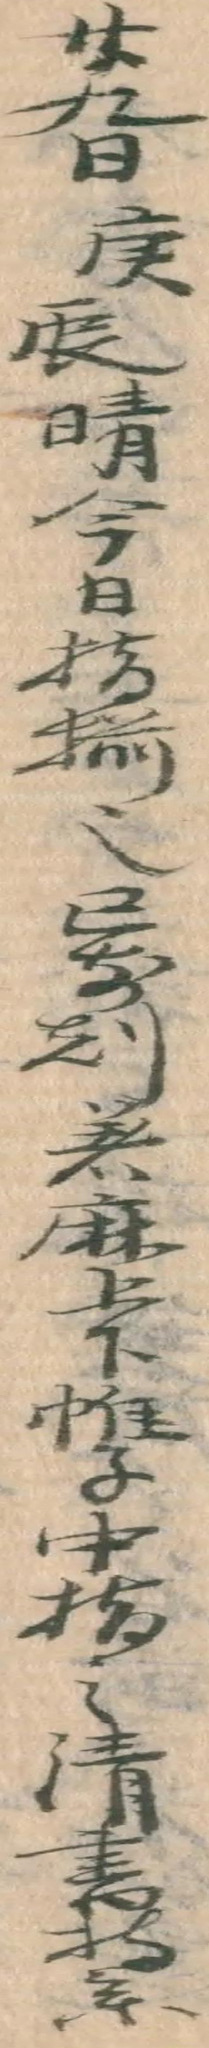廿九日庚辰晴今日指揃也巳前刻着麻上下帷子中指之清書持参
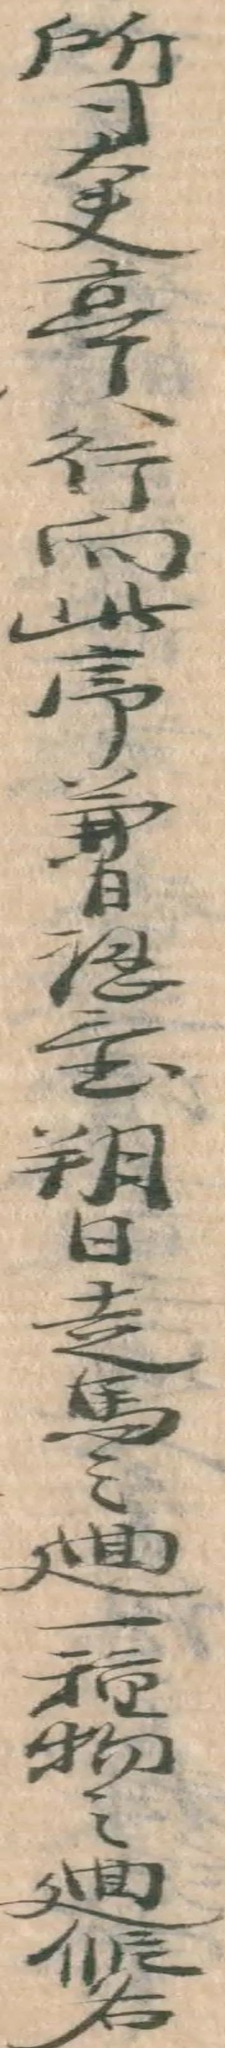所司大夫亭へ行向此序兼日認置朔日走馬之廻一種物之廻仮名
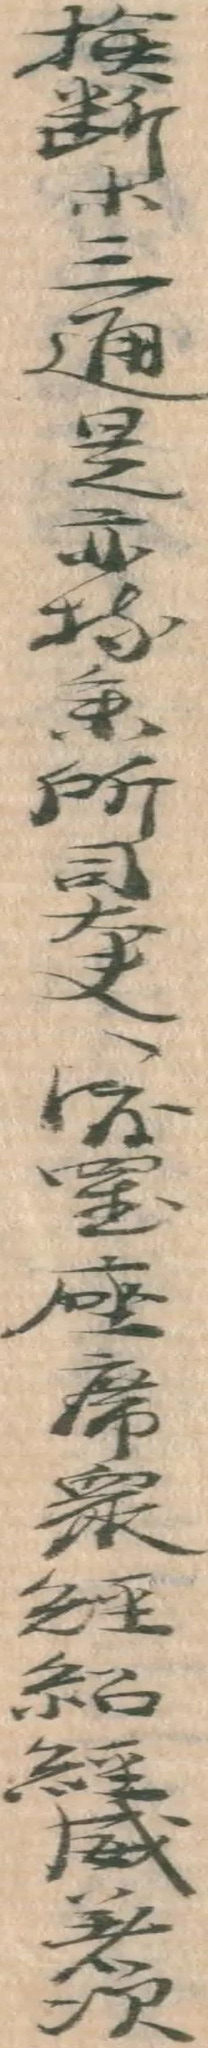槍断等三通是亦持参所司大夫へ渡置座席衆経紹経威着次
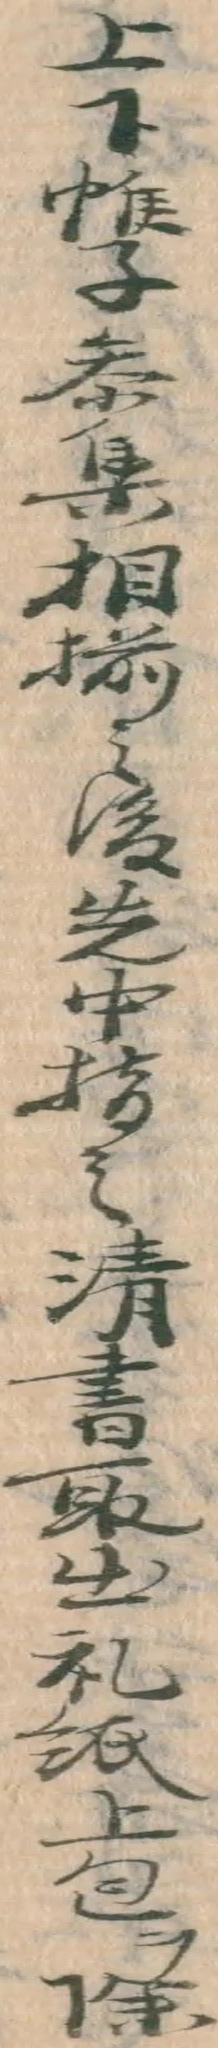上下帷子参集相揃之後先中指之清書取出礼紙上包ヲ除
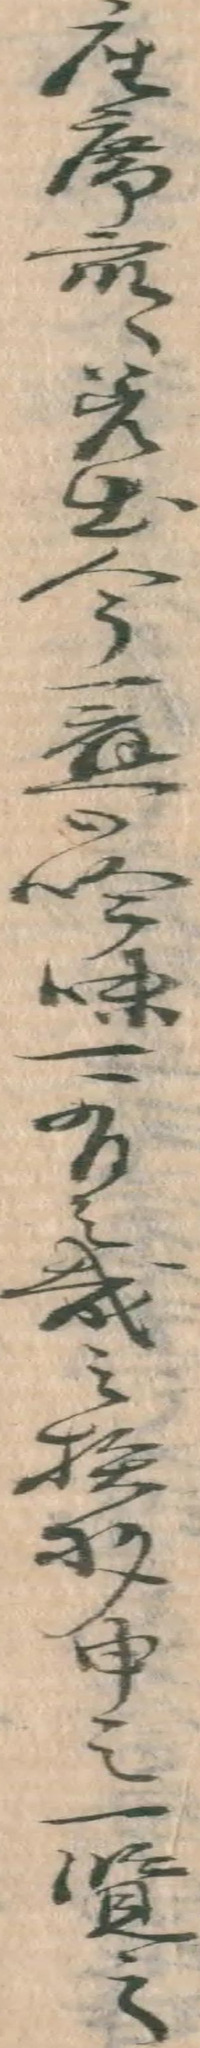座席衆へ差出今一應御吟味可有之哉之挨拶申之一覧之
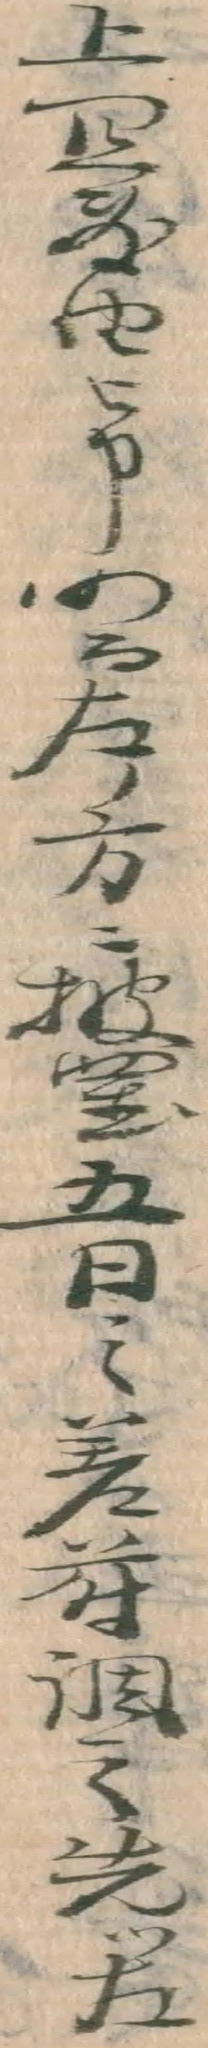上宜敷由被申仍而左ノ方ニ披置五日之差符調之先ツ左
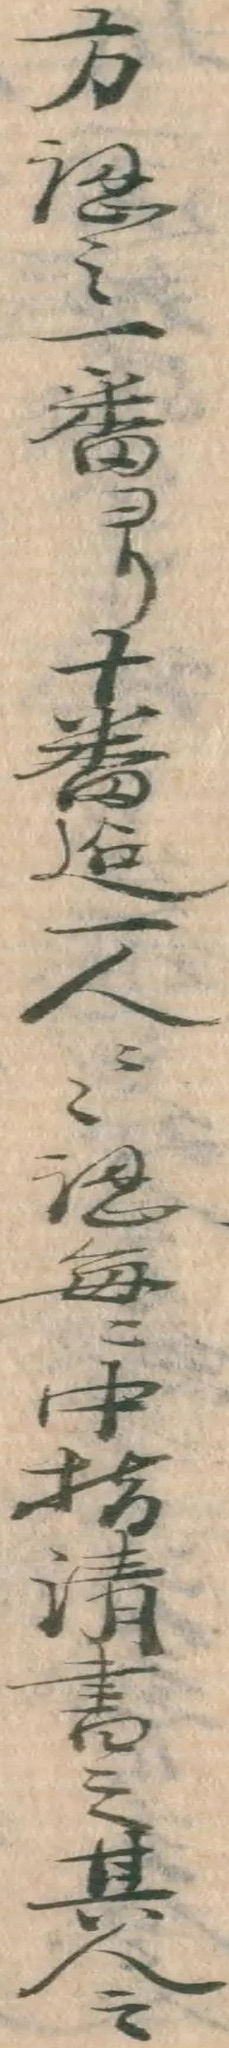方認之一番ヨリ十番迄一人々々認毎ニ中指清書之其人之
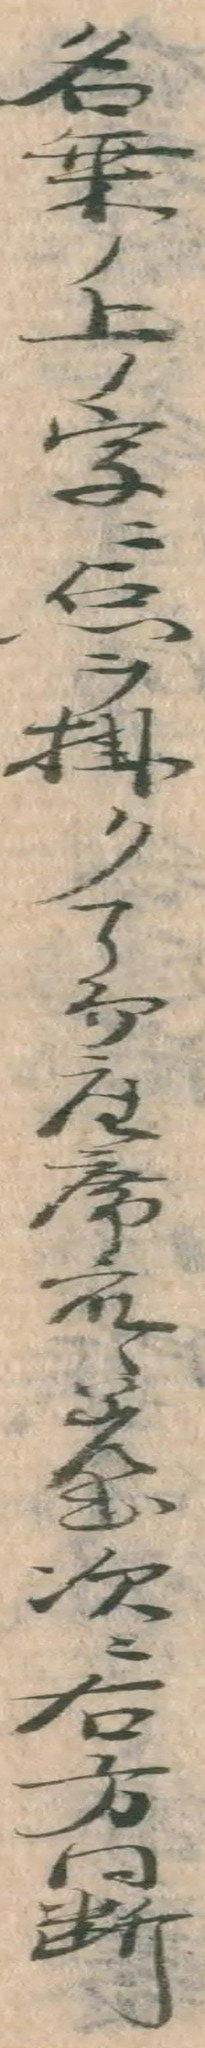名乗ノ上ノ字ニ点ヲ掛リ了而座席衆へ差出次ニ右方同断
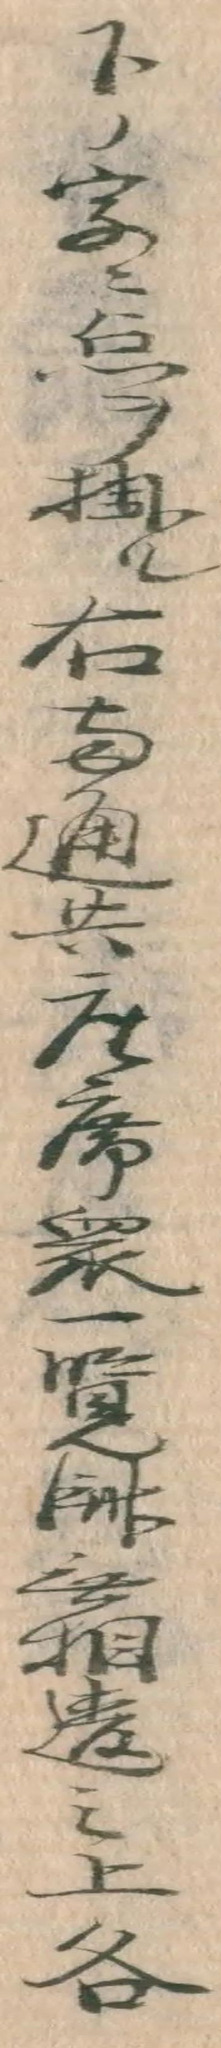下ノ字ニ点ヲ掛ル右両通共座席器一覧済無相違之上各
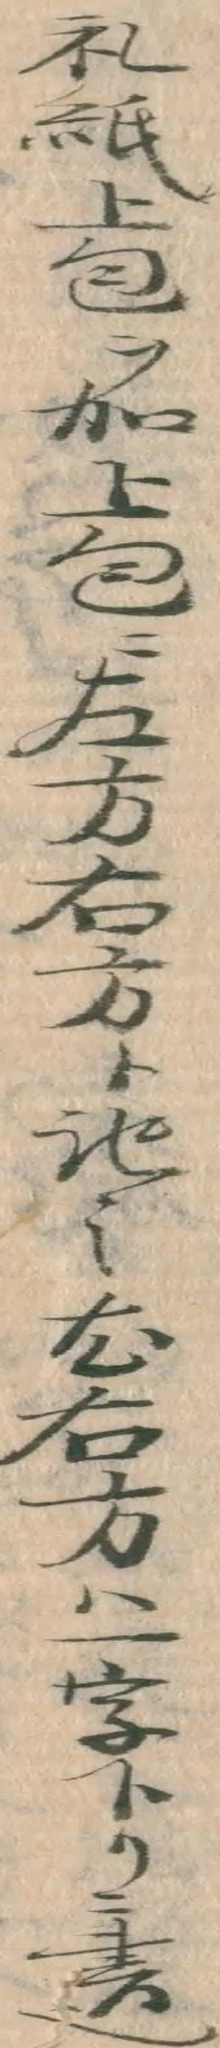礼紙上包ヲ加上包ニ左方右方ト記之尤右方ハ一字下リ書之
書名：賀茂社記録. 第65冊
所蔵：国立国会図書館 National Diet Library, JAPAN
